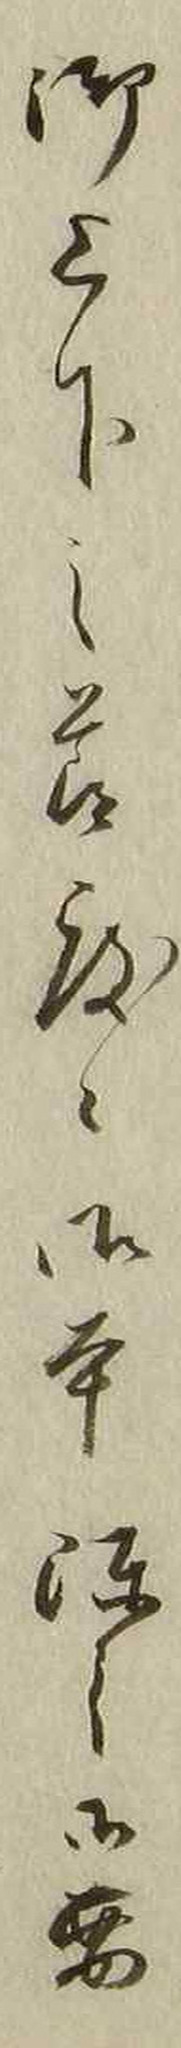御上下之節度々御本陣之御要
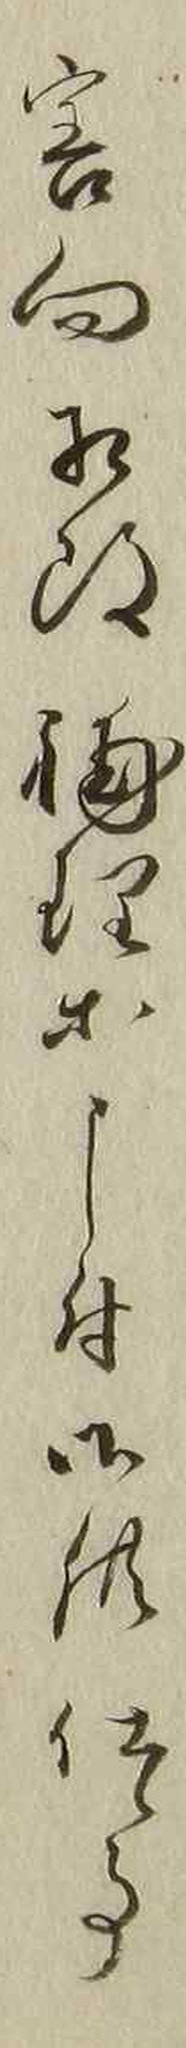害向相改補理等申付御供仕候事
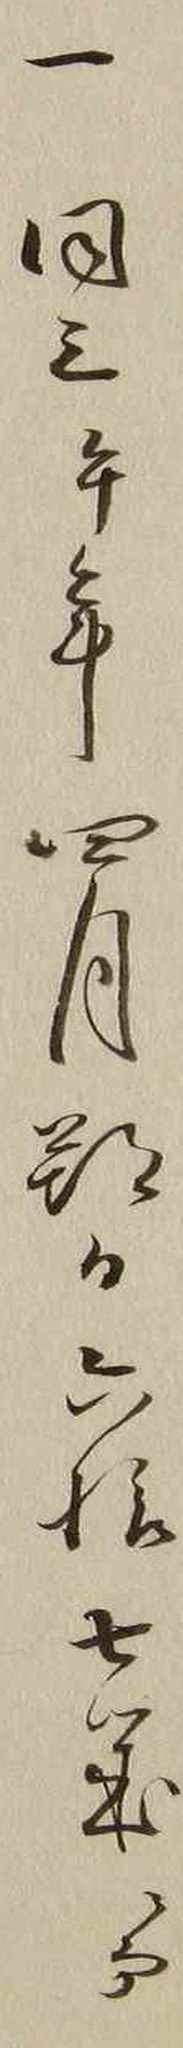一同三午年四月朔日六拾七歳ニ而
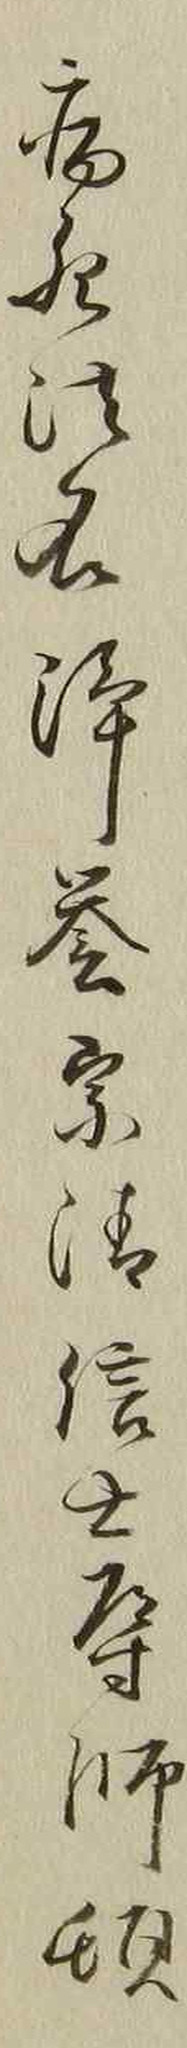病死法名浄誉宗清信士導師頓
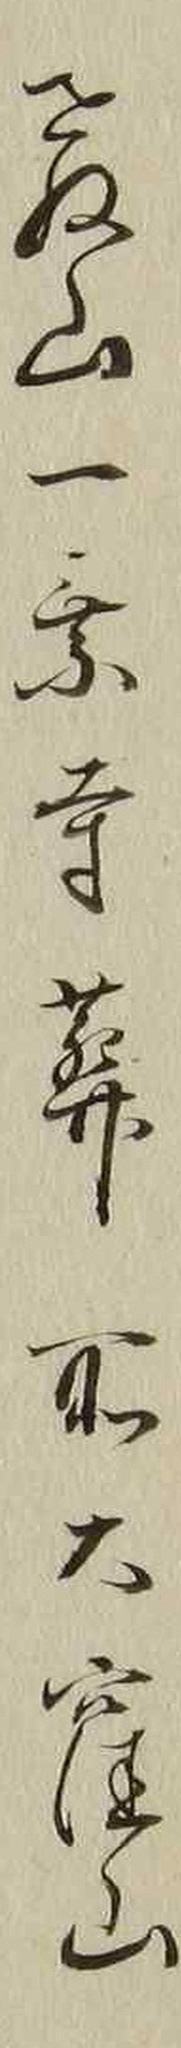教山一乗寺葬所大窪山
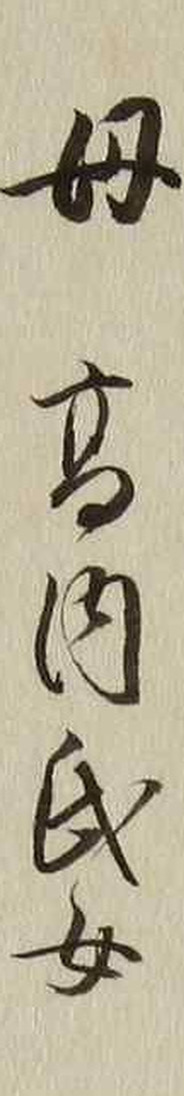母高内氏女
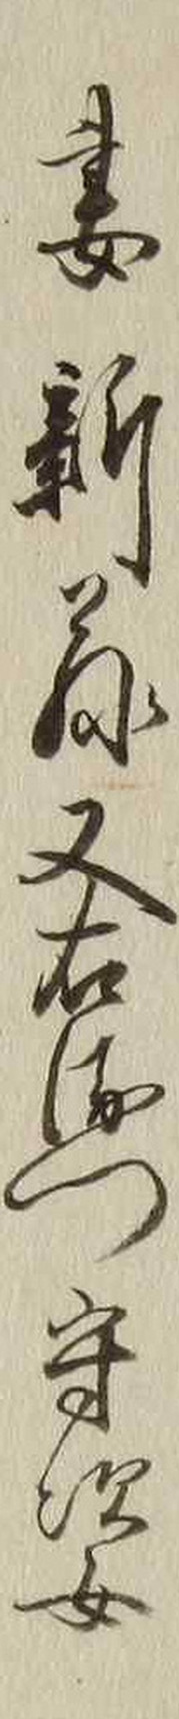妻新藤又右衛門守次女
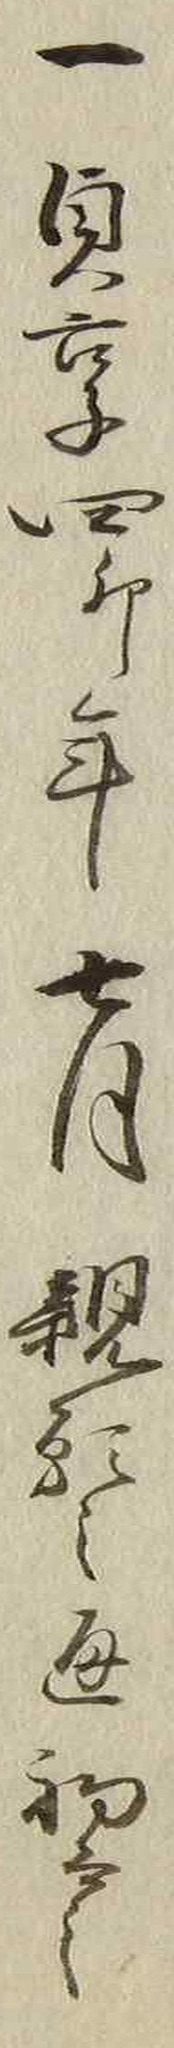一貞享四卯年七月親願之通初而之
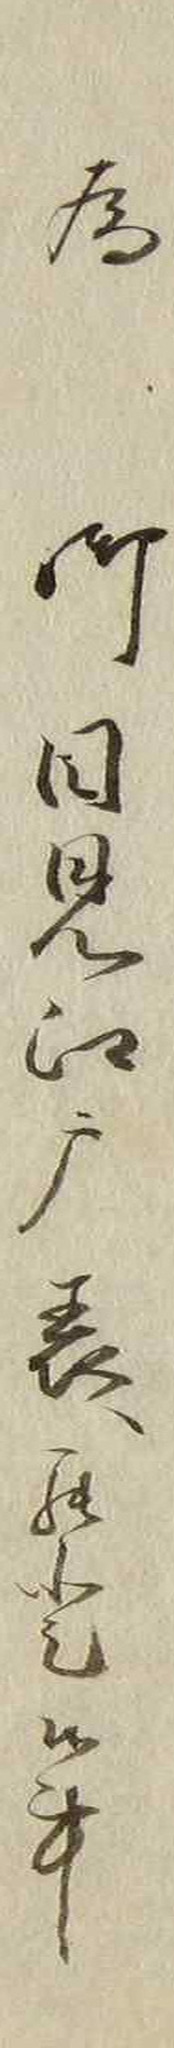為御目見江戸表へ罷登候事
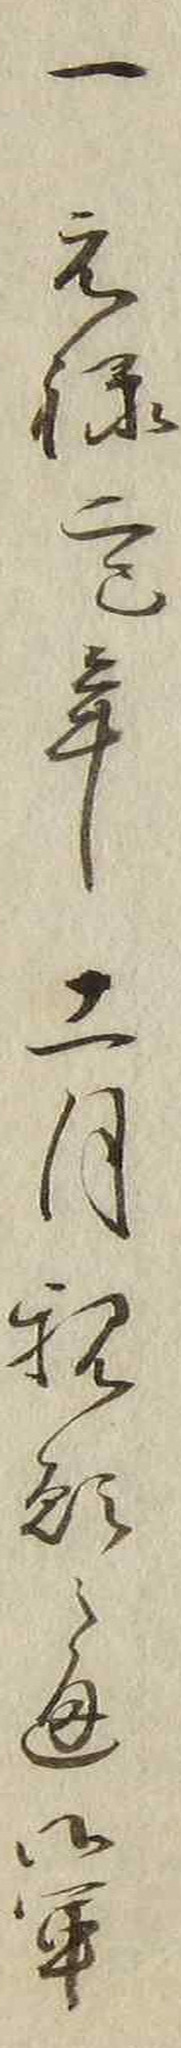一元禄二巳年十一月親願之通御軍
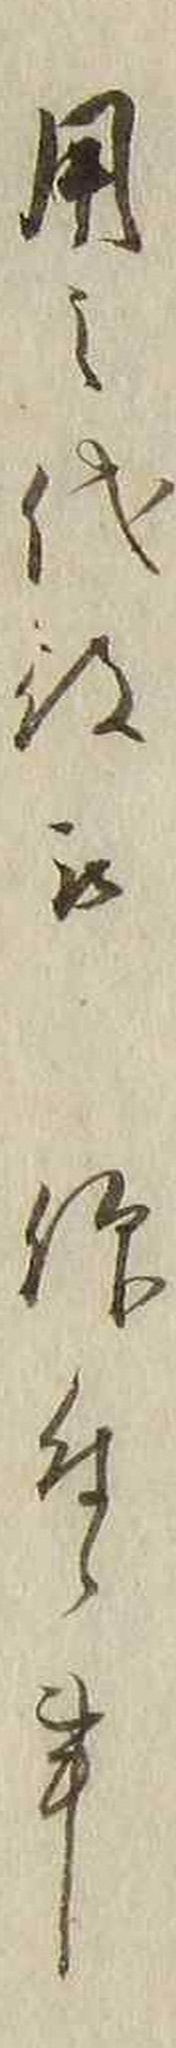用之代役被仰付候事
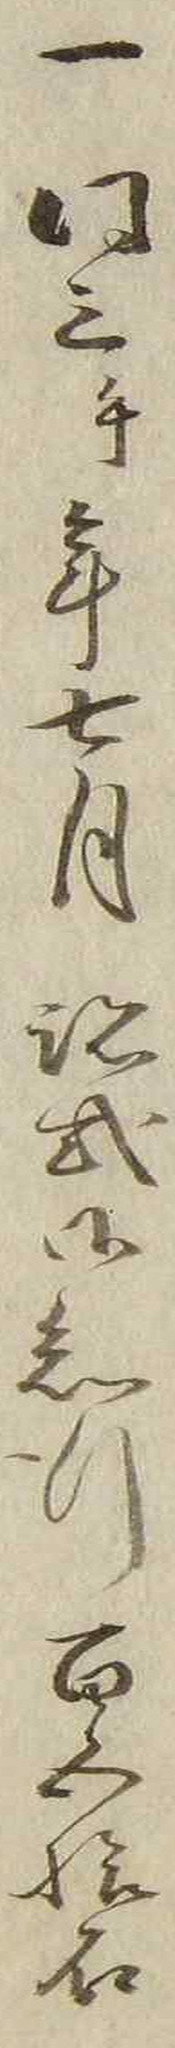一同三午年七月跡式御知行百五拾石

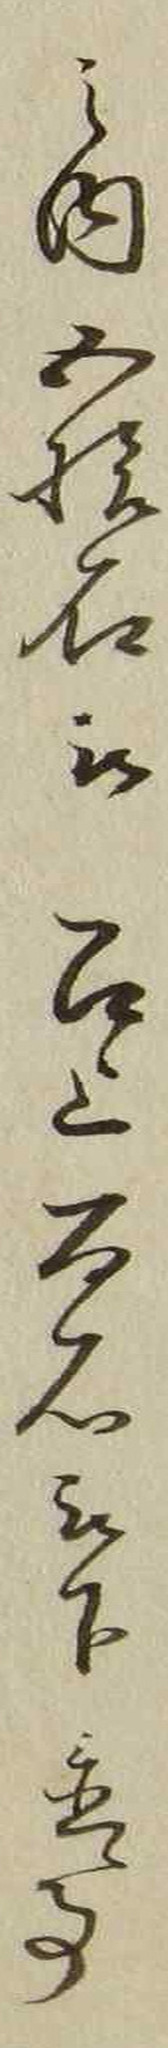之内五拾石被召上百石被下置候事
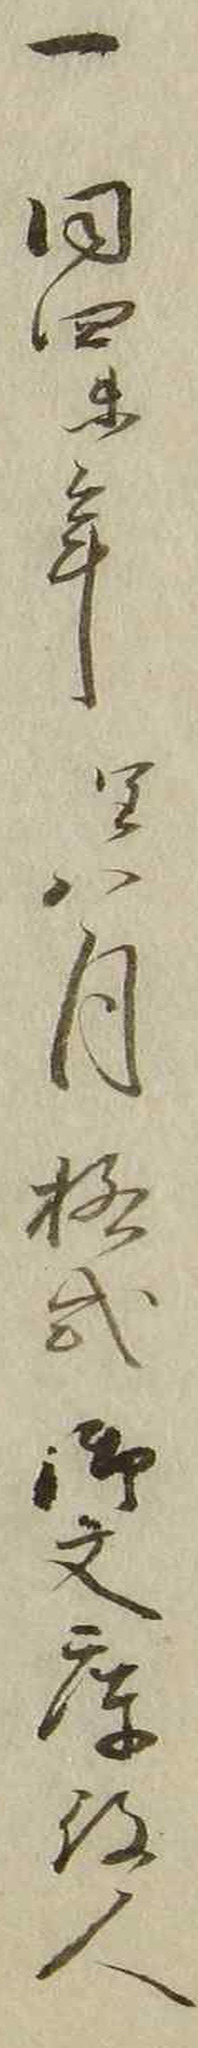一同四未年閏八月格式御文庫役人
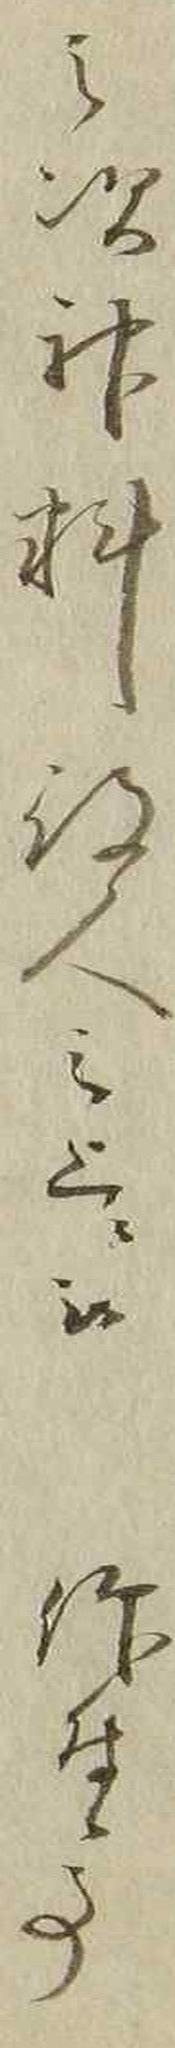之次神料役人之上ニ被仰付候事
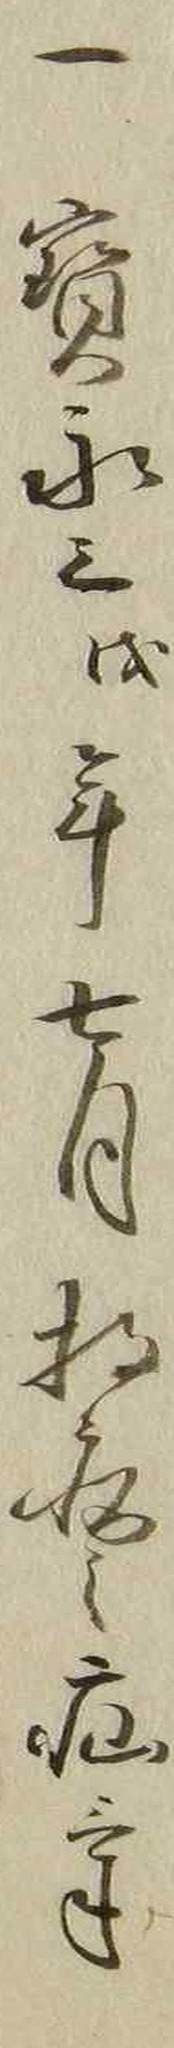一宝永三戊年七月持病之疝気
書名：諸士系譜　巻之28　い之部28
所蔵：会津若松市立会津図書館
